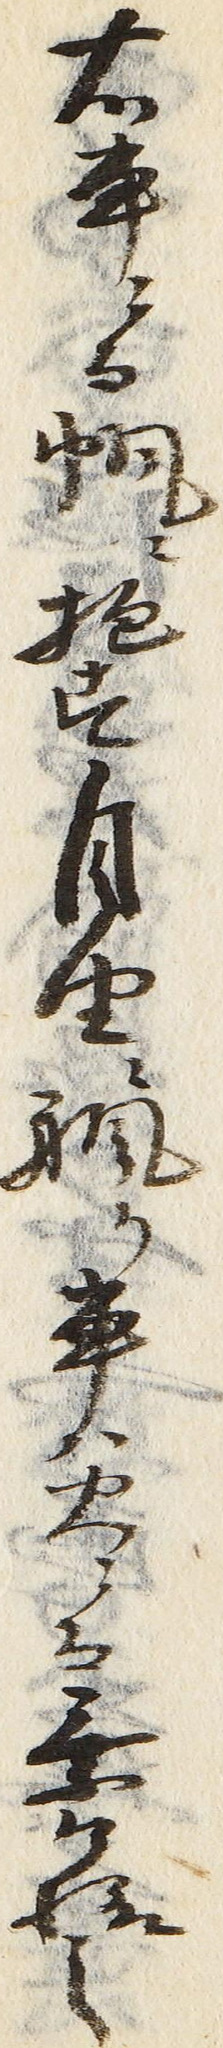右車ニ而帆ニ抱す自由ニ䑺り車ハ火ニて乗候様之
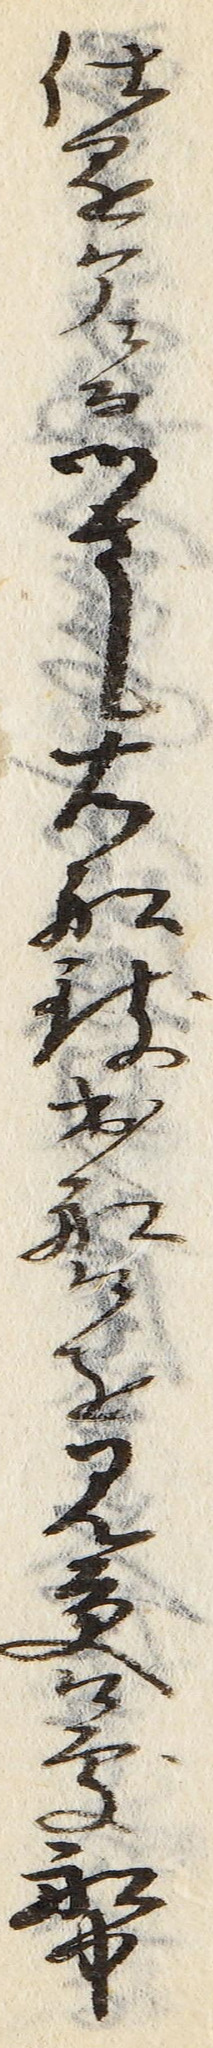仕懸ケニ而御座候右舩致出帆候を見受候處舩中
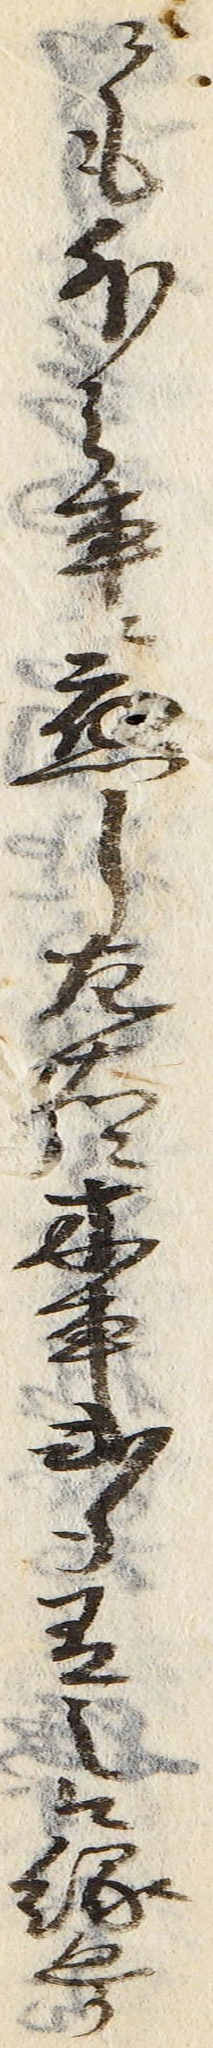ニも外之車ニ應し左右ニ木車弐ツ有之候縁廻り
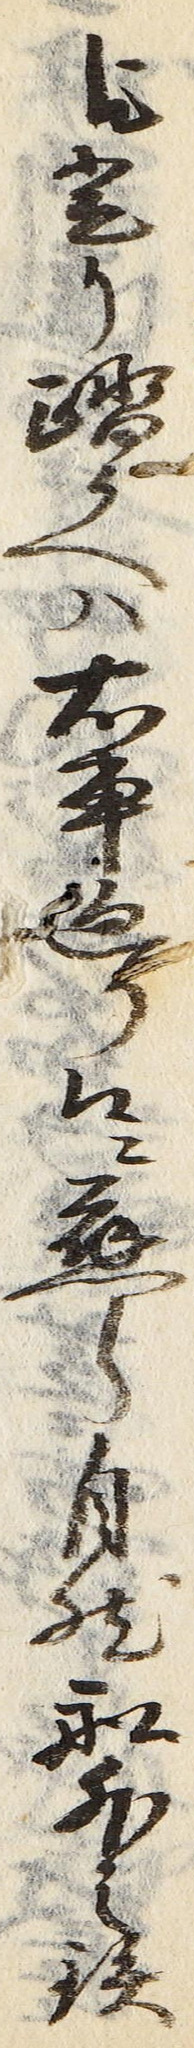江登り踏候へハ右車廻り候ニ應し自然舩外之鉄
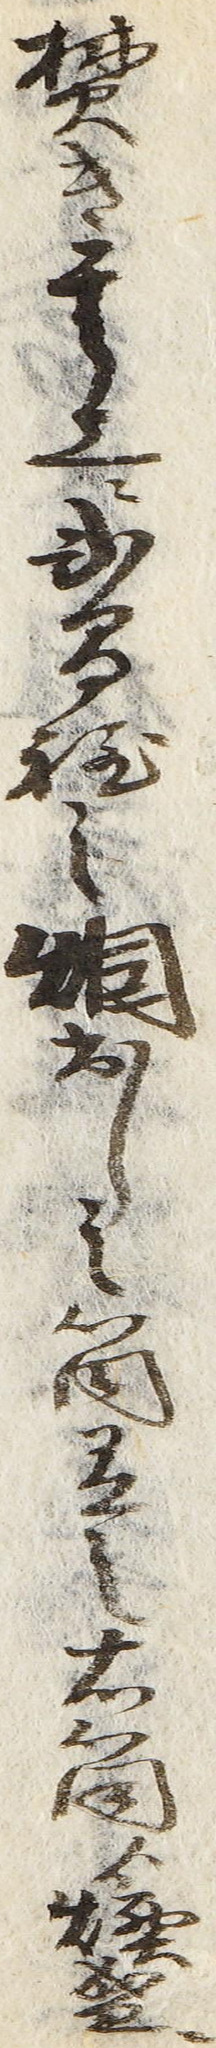焚き其上ニ弐間程之烟出し之筒有之右筒ゟ煙盛ニ
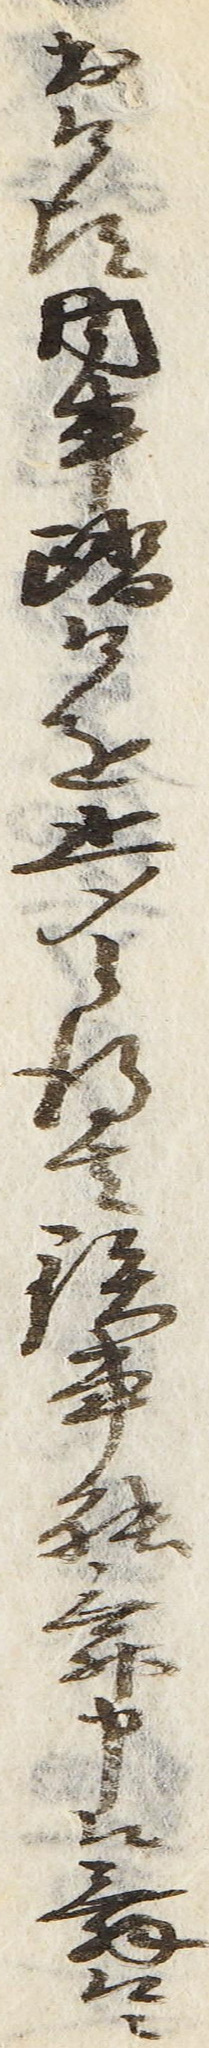出候頃内車踏候を止メ候得者鉄車能舞申候舞候ニ
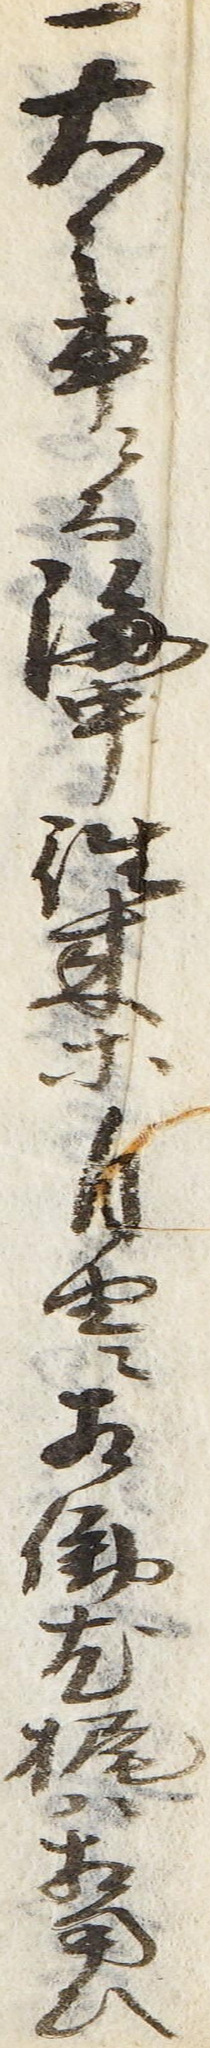一右之車ニ而海中往来等自由ニ相働尤梶ハ相用ひ
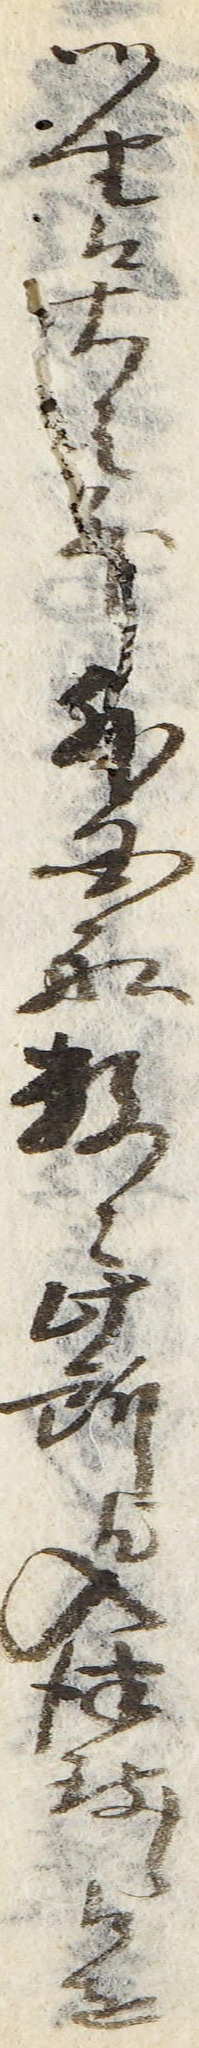御座候右之外外国舩数々此所江入津致し候を
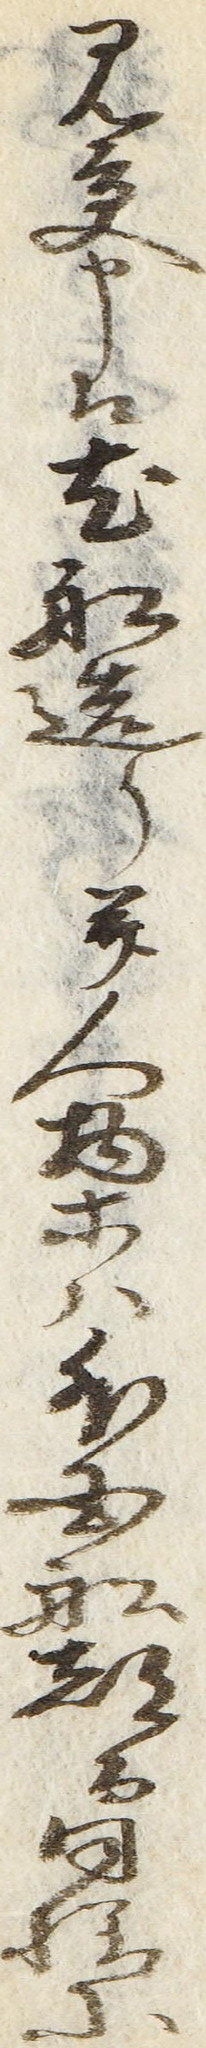見受申候尤舩送り幷人物等ハ外国舩都而同様に
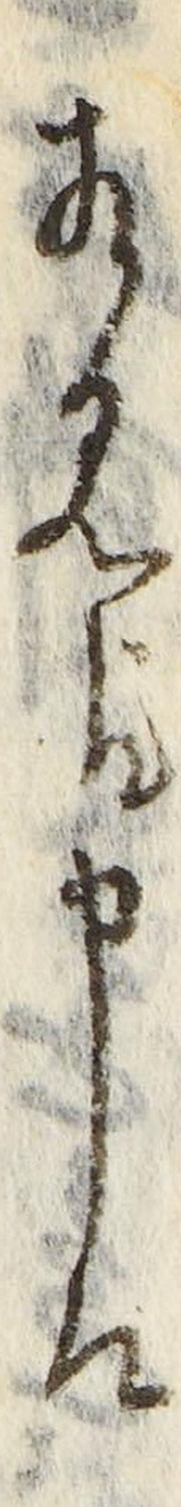相見江申候

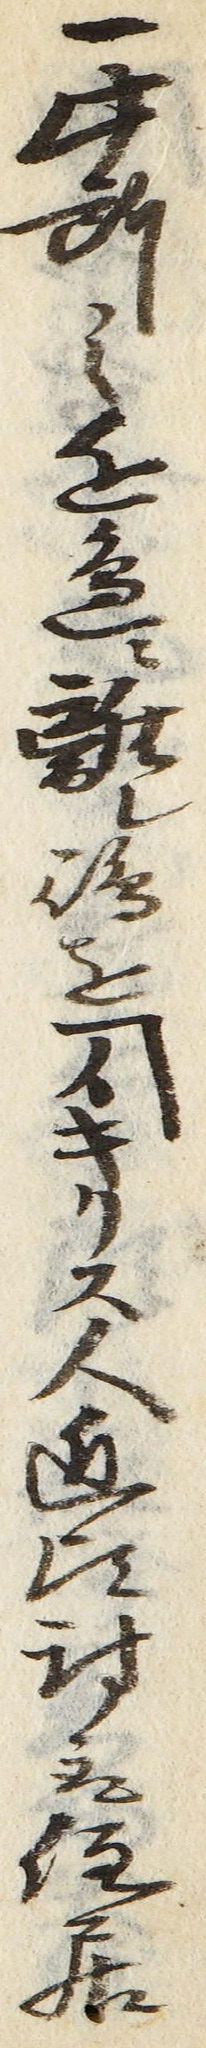一此所之近邊ニ離レ嶋を「イキリス人近頃討取住居
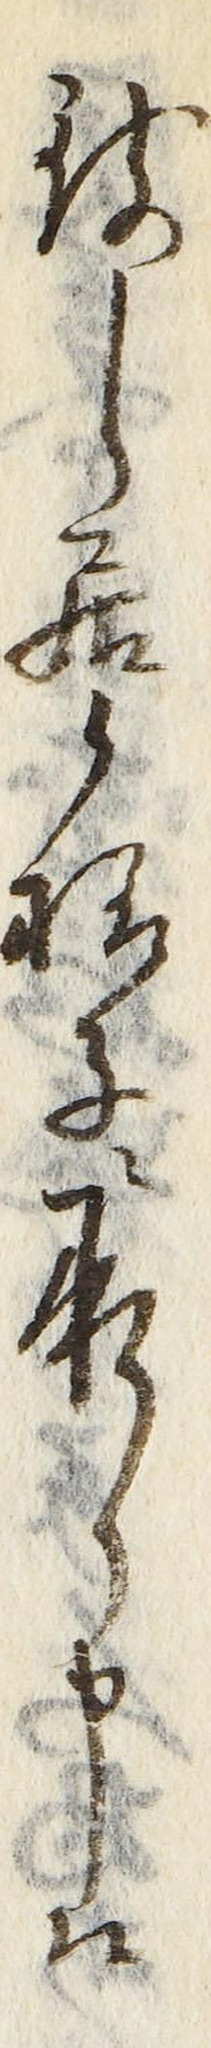致し居候様子ニ承り申候
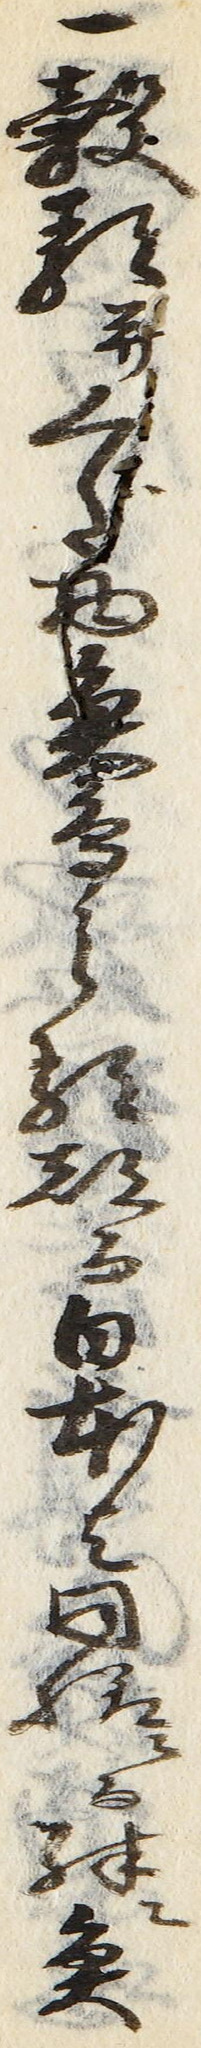一穀類幷くだ物𩵋鳥之類都而日本と同様ニ而殊ニ𩵋
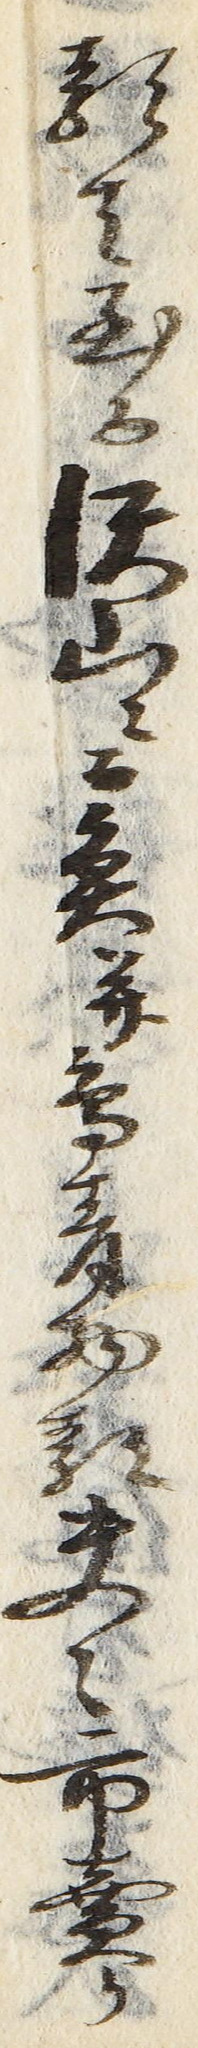類者至而沢山ニ而𩵋幷鳥青物類夫々市賣り
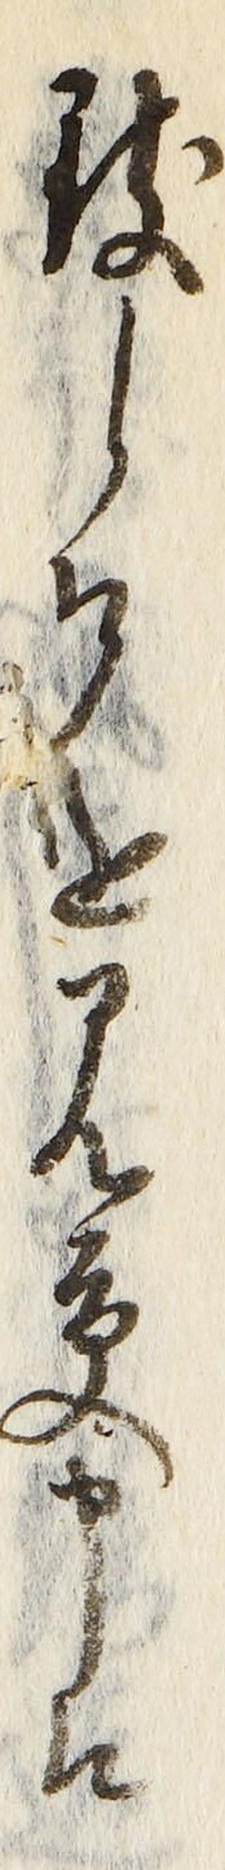致し候を見受申候
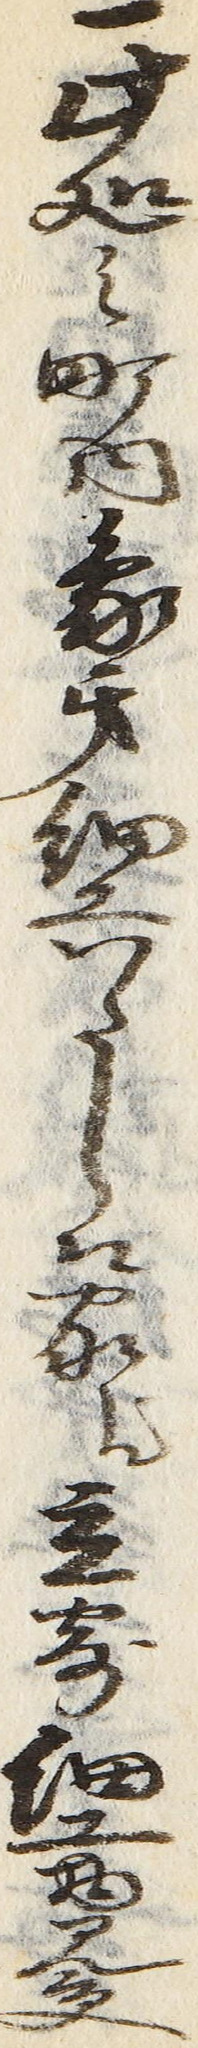一此所之町内象牙細工いたし候家江立寄細工物見受
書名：漂流人善助聞書
